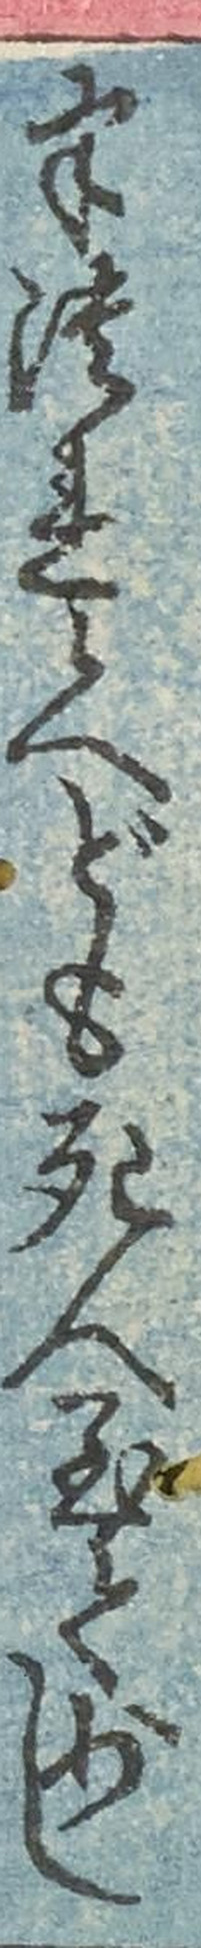半潰れ候へども死人至て少し
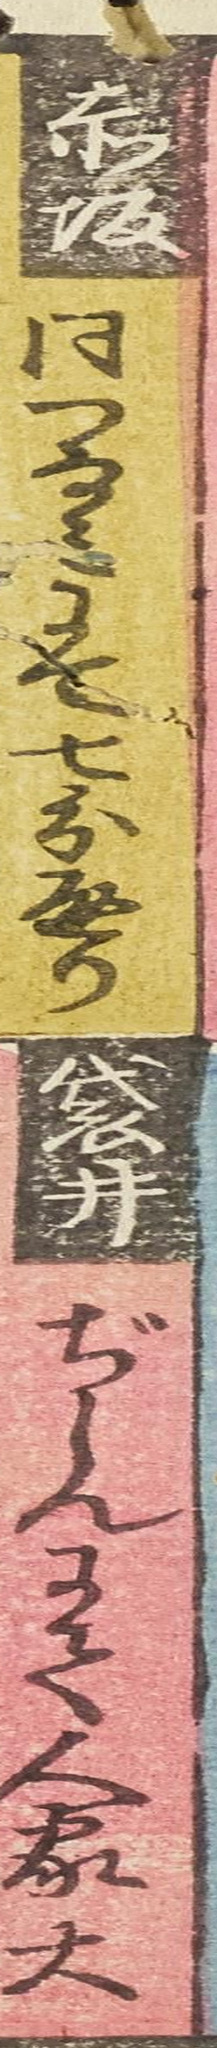赤坂同つなみにて七分通り
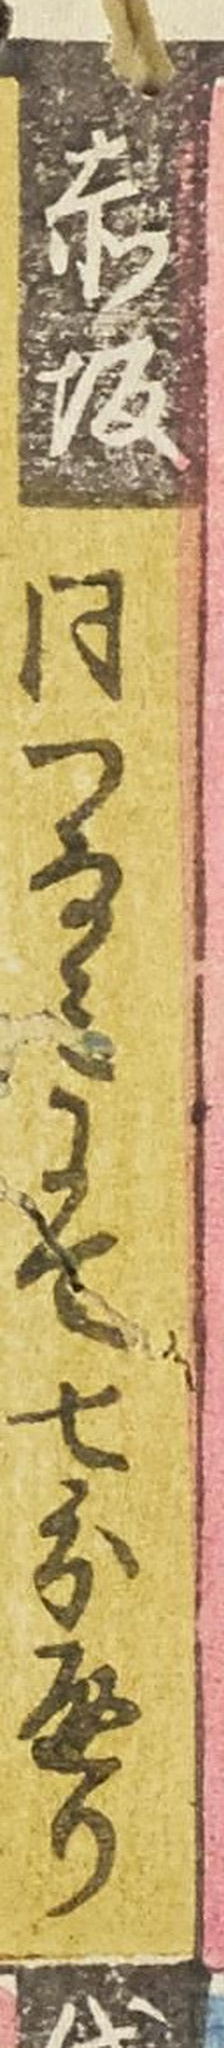赤坂同つなみにて七分通り
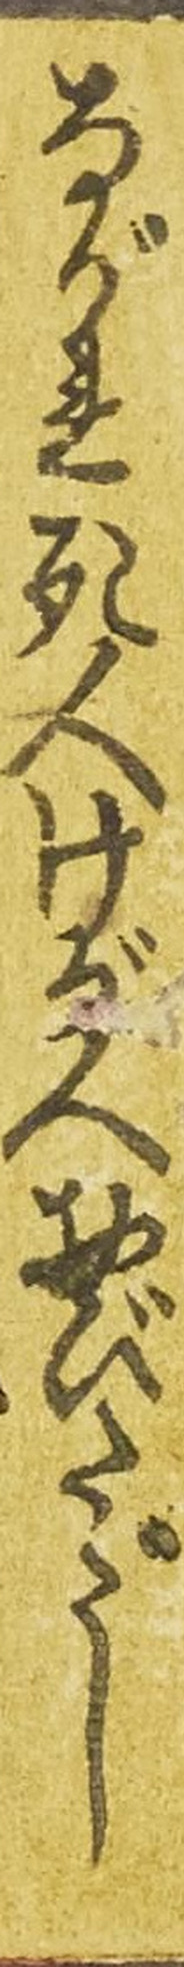ながれ死人けが人おびたゝし
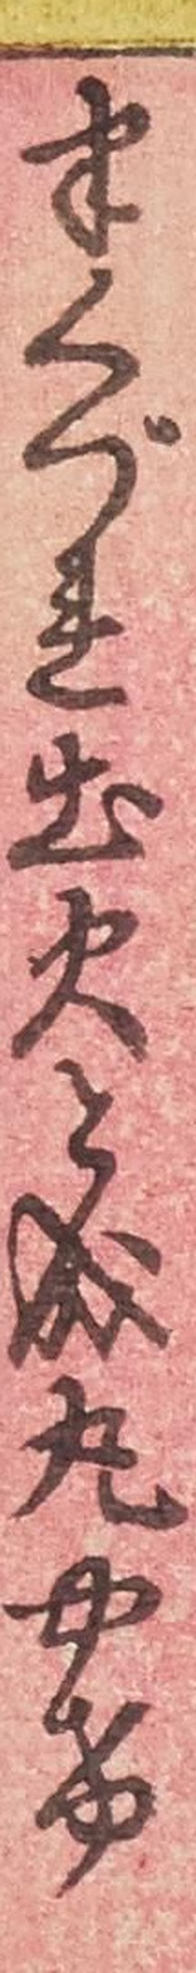半くづれ出火と成丸やけ
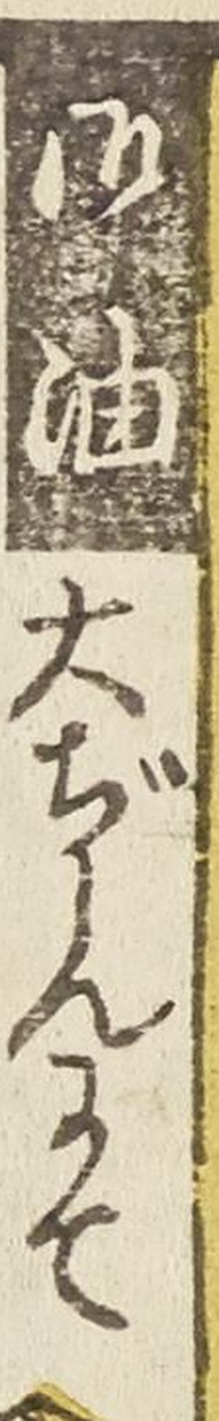御油大ぢしんにて
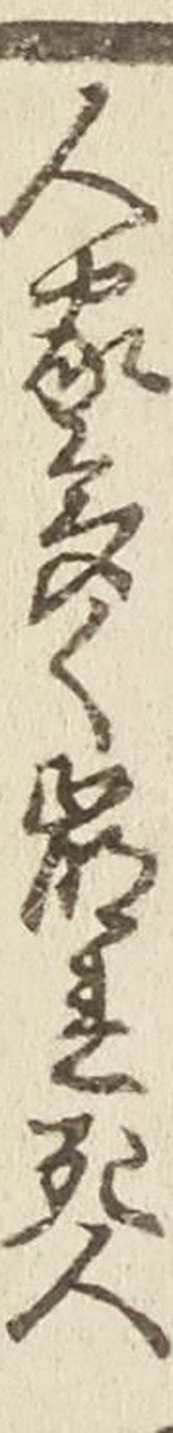人家多く崩れ死人
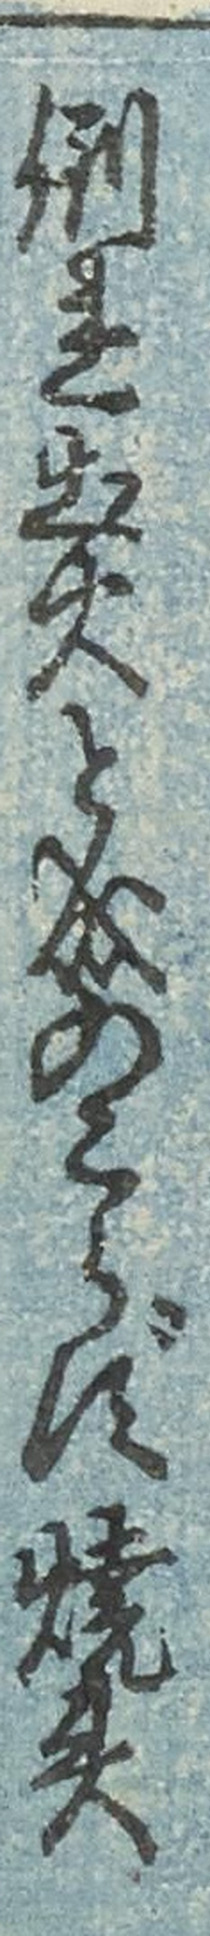倒れ出火と成のこらず焼失
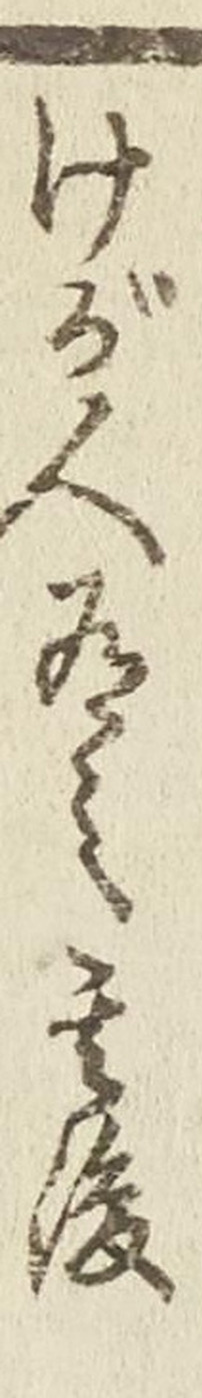けが人有之其後
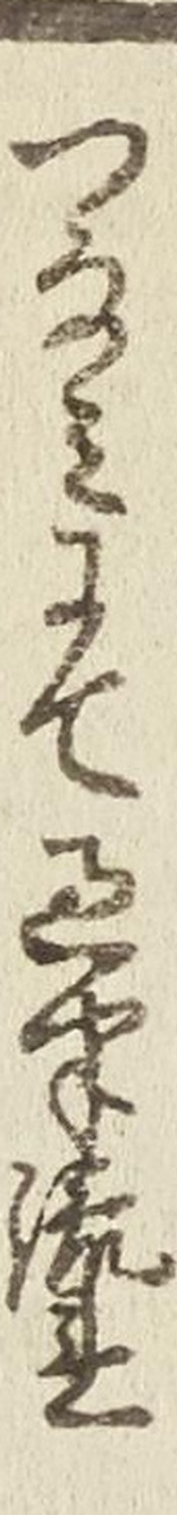つなみにて過半流れ
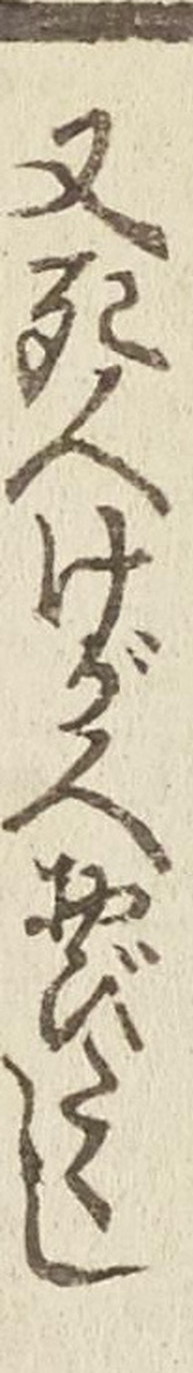又死人けが人おびたゝし
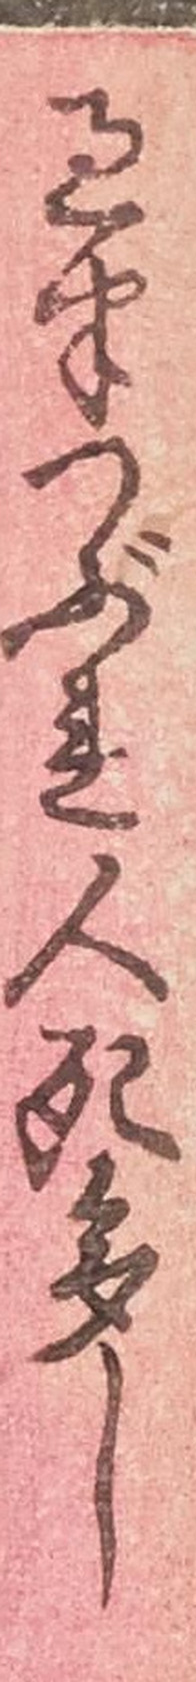過半つぶれ人死多し
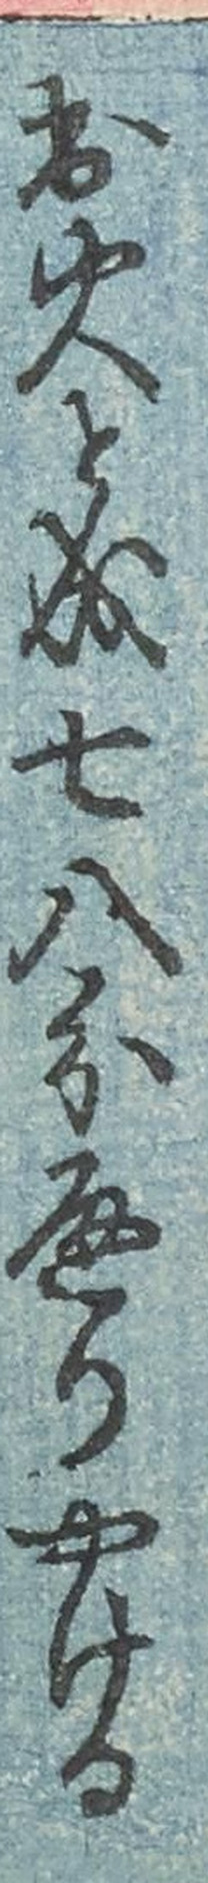出火と成七八分通りやける
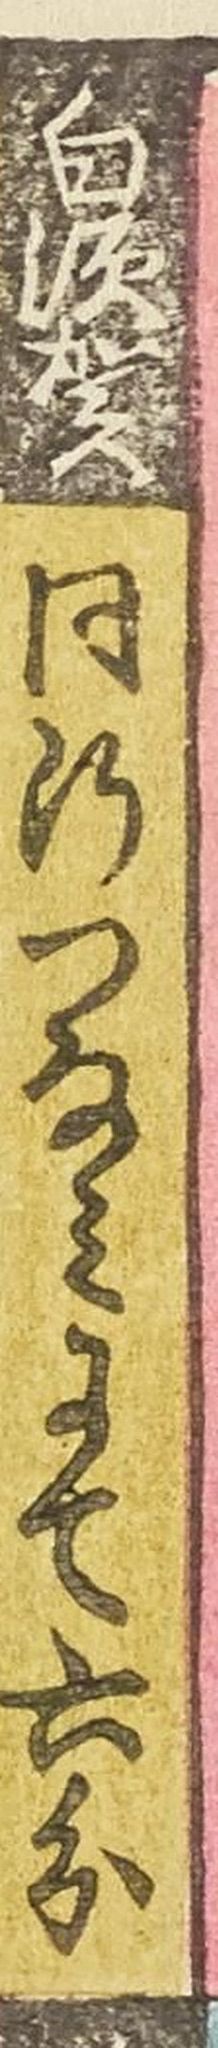白須賀同断つなみにて六分
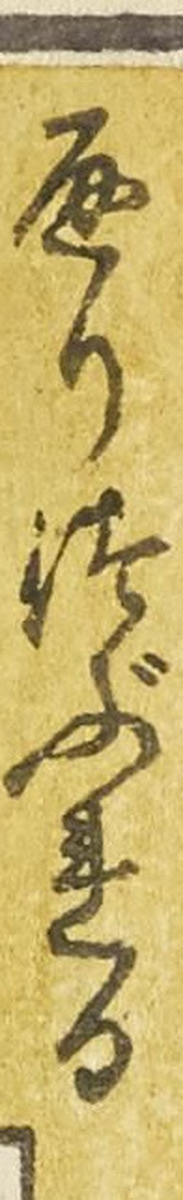通りつぶれる
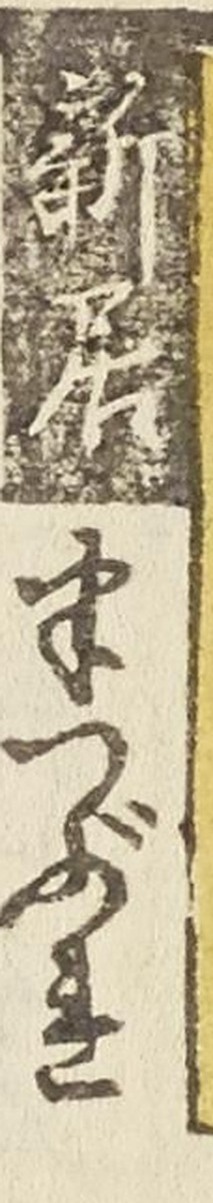新居半つぶれ
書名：大地震大津浪末代噺種　（二編　全）
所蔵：東京大学地震研究所図書室 Earthquake Research Institute Library, The University of Tokyo, JAPAN
